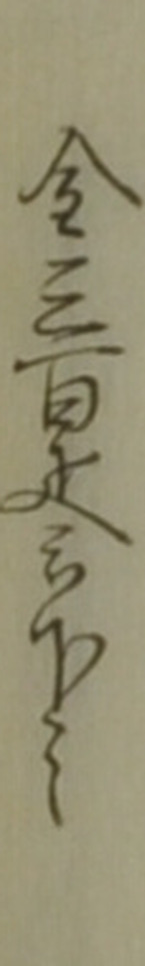金三百疋被下之
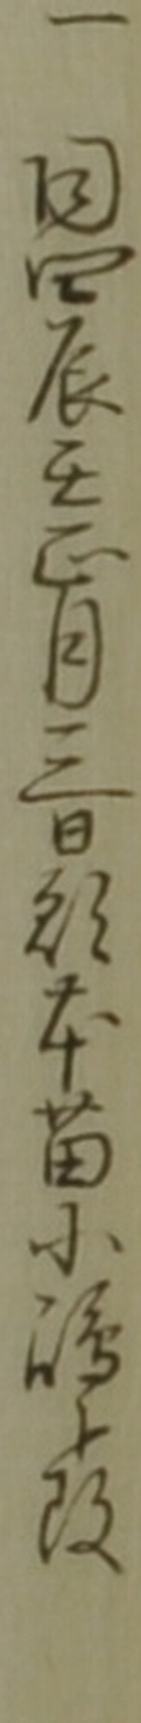一同四辰閏正月三日願本苗小嶋ト改
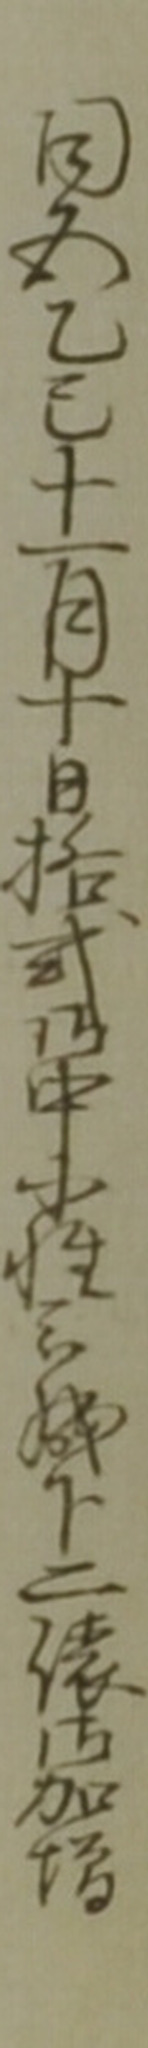一同五乙巳十一月十日格式御中小性被成下二俵御加増
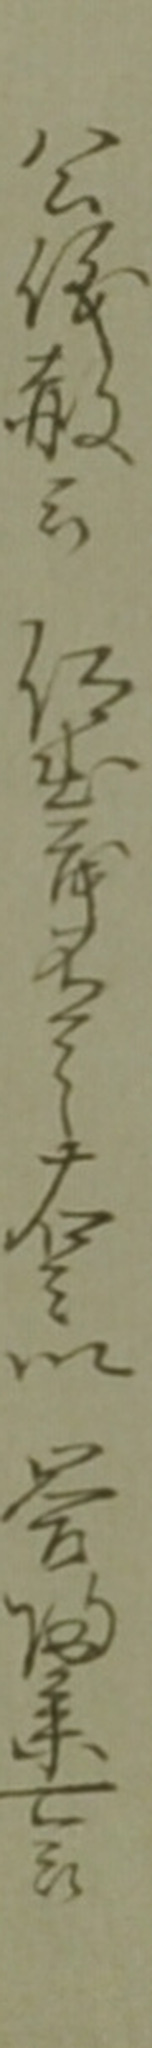公儀赦被仰出茂有之右之以思召帰参可被

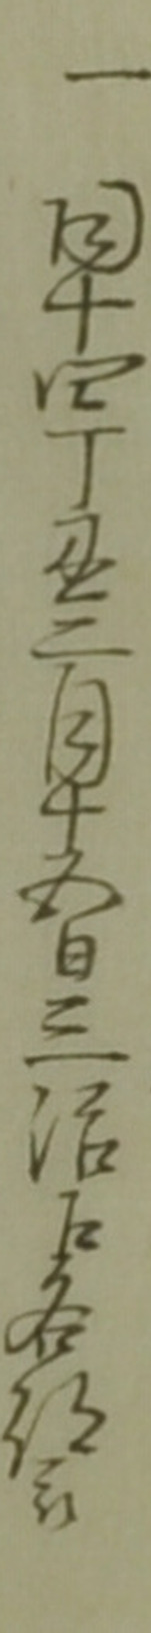一同十四丁丑二月十五日三治江名跡被
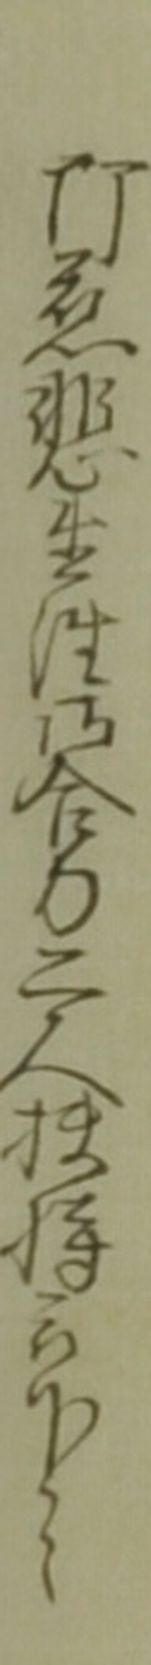御慈悲生御合力二人扶持被下之
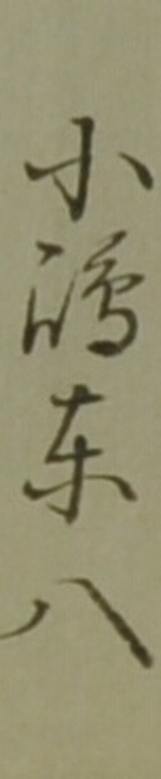小嶋東八
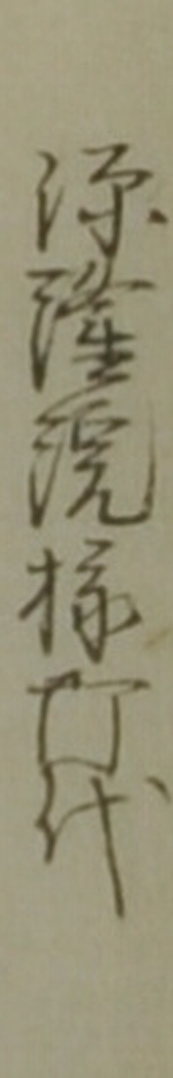源隆院様御代
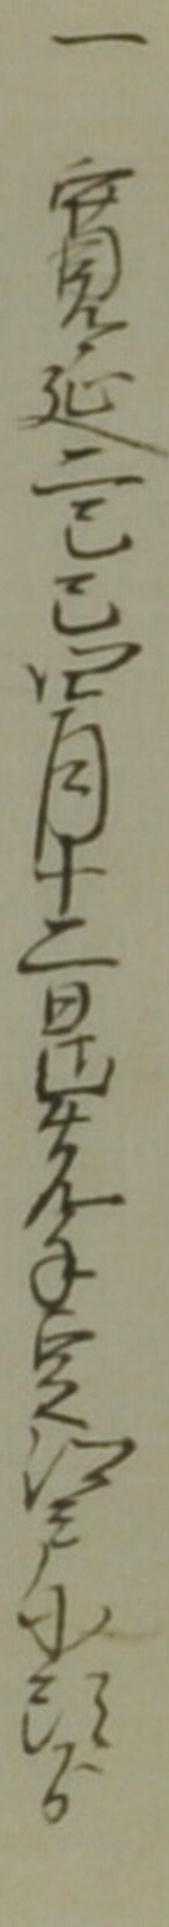一寛延二己巳四月十二日御先手定江戸小頭ゟ
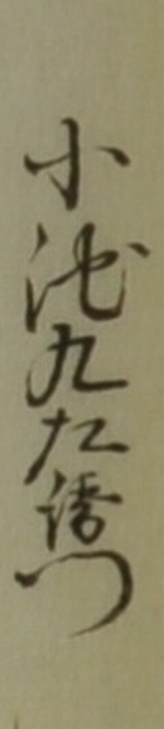小池九左衛門
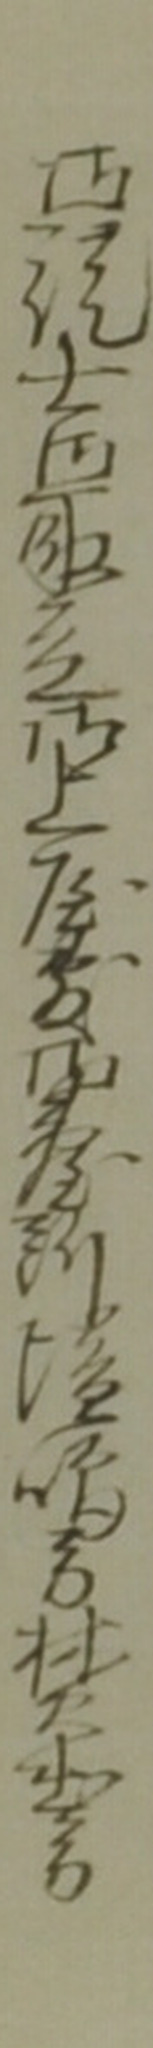御徒士御取立御上屋敷御台所塩噌方焚出方
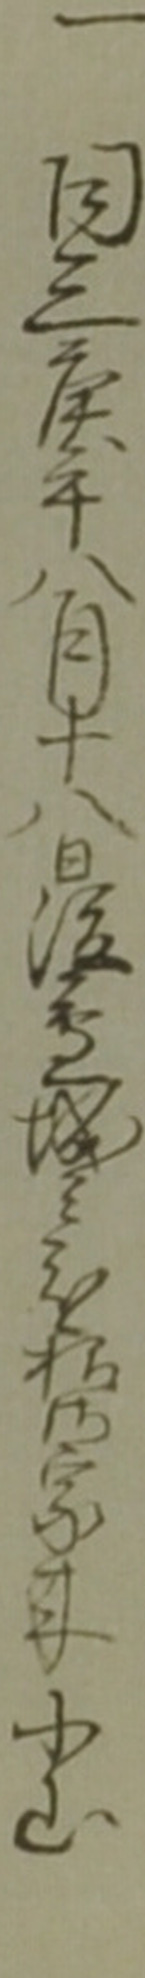一同三庚午八月十八日渡邊城之進様御家来小山
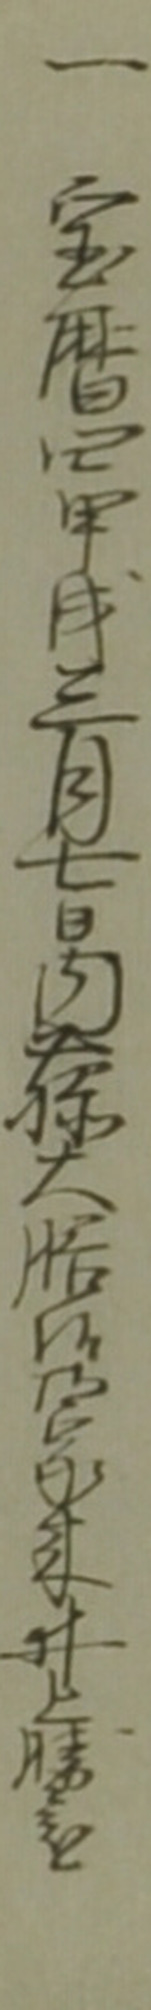一宝暦四甲戌三月七日内藤大膳様御家来井上勝之進
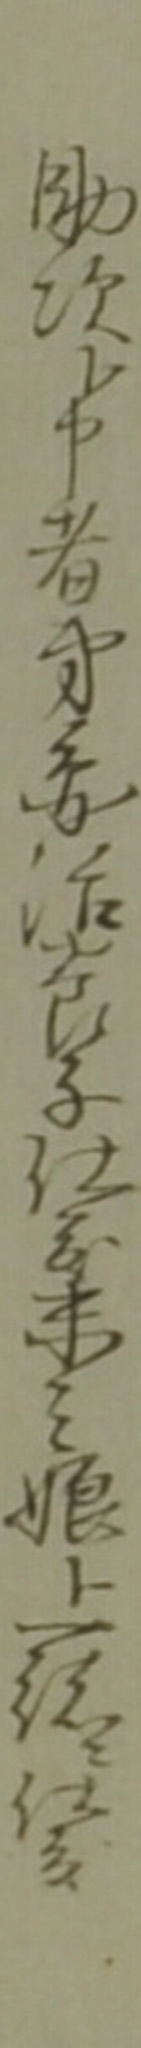助次申者弟円治養子仕度末之娘一緒仕度
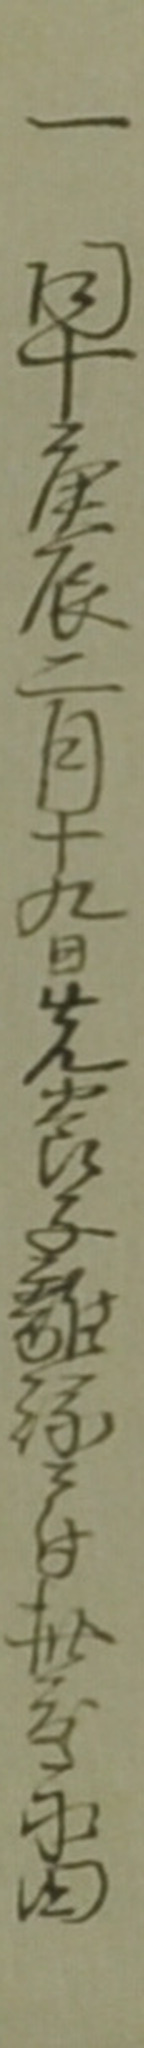一同十庚辰二月十九日先養子離縁ニ付此度永田
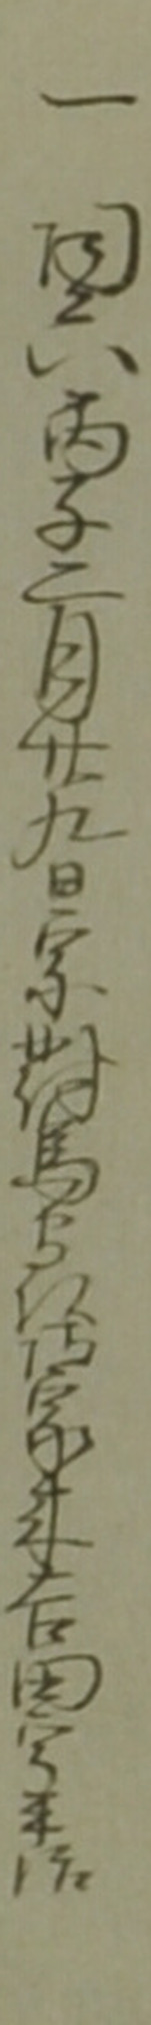一同六丙子二月廿九日宗対馬守様御家来吉田宇平治
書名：無足廃家（弐）
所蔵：伊那市立高遠町図書館・合同会社AMANE
